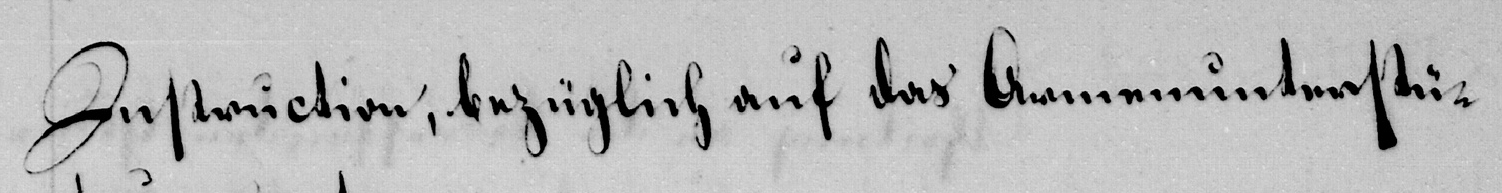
Instruction, bezüglich auf das Armenunterstü¬
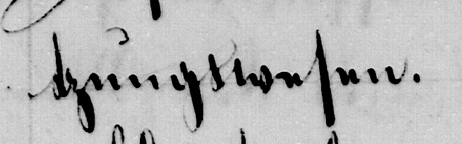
tzungswesen.
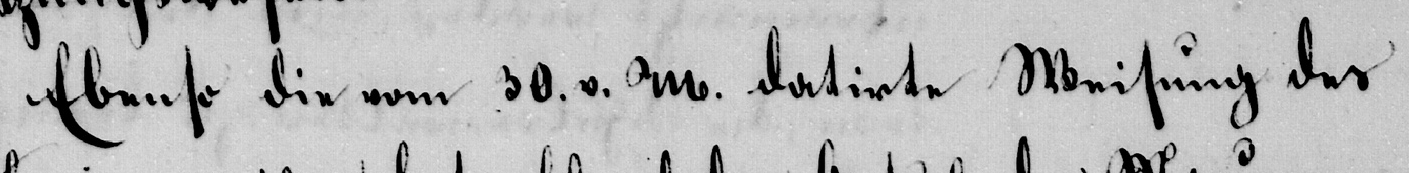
Ebenso die vom 30. v. M. datirte Weisung des
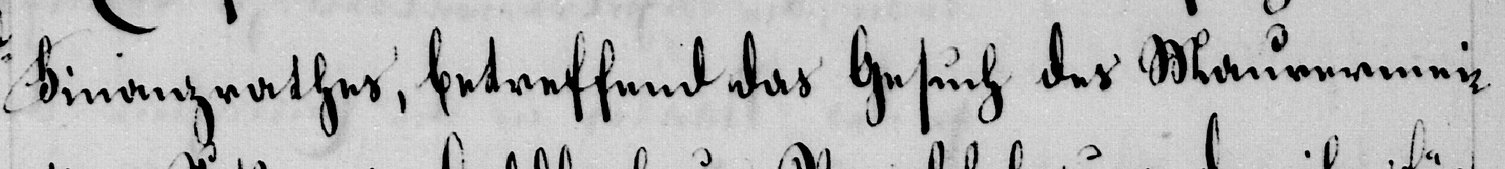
Finanzrathes, betreffend das Gesuch des Mauermei¬
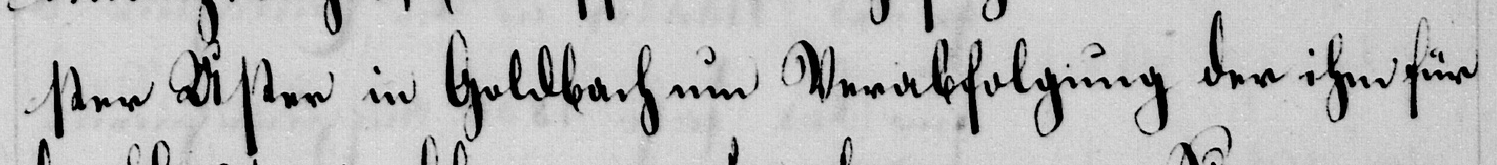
sters Uster in Goldbach um Verabfolgung der ihm für
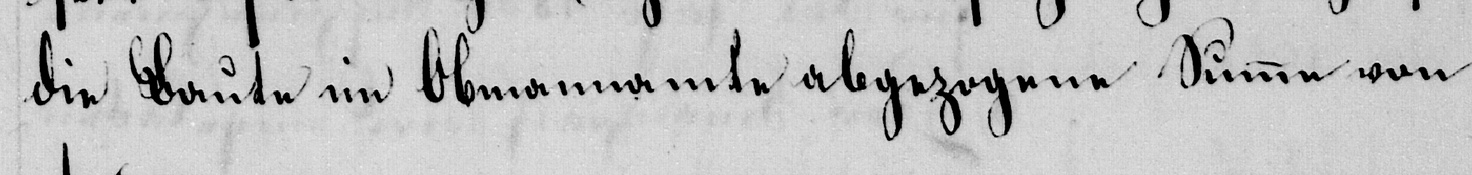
die Baute im Obmannamte abgezogene Summe von
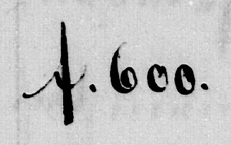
f. 600.
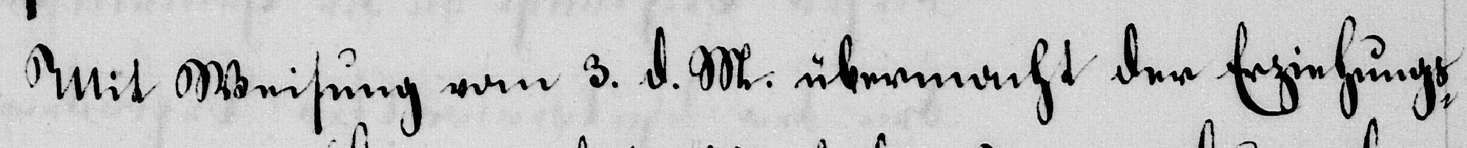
Mit Weisung vom 3. d. M. übermacht der Erziehungs¬
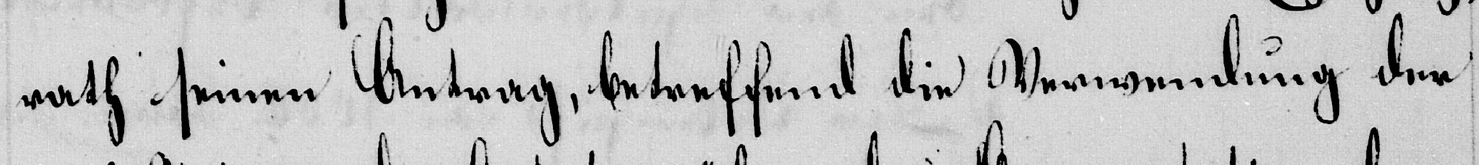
rath seinen Antrag, betreffend die Verwendung der
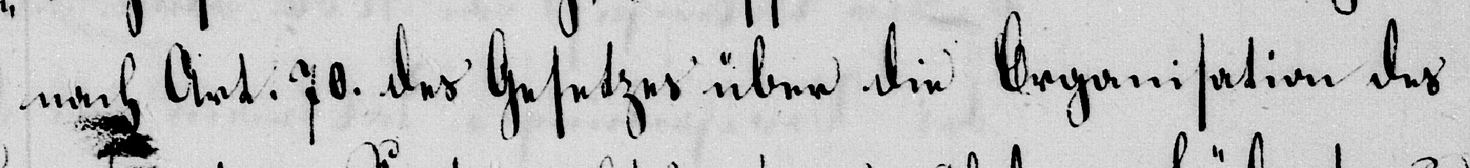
nach Art. 70. des Gesetzes über die Organisation des
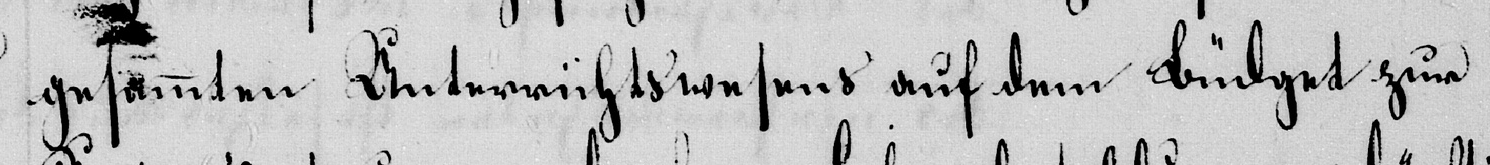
gesamten Unterrichtswesens auf dem Büdget zur
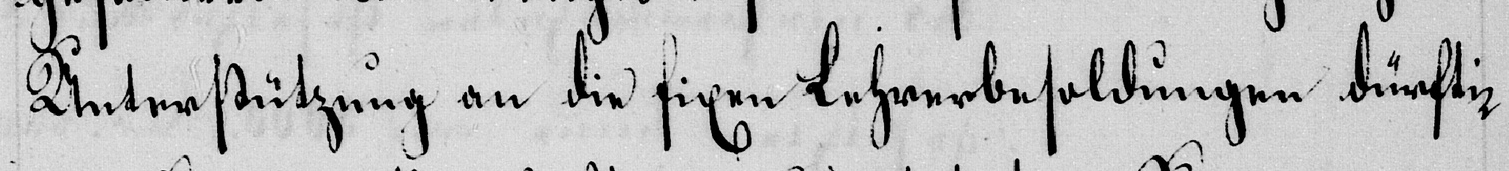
Unterstützung an die fixen Lehrerbesoldungen dürfti¬
